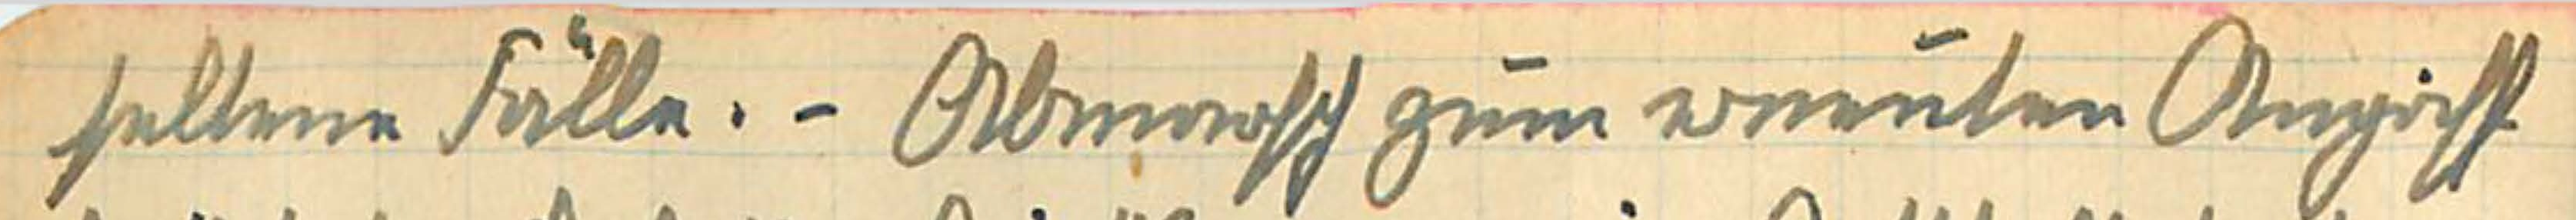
seltene Fälle. – Abmarsch zum erneuten Angriff
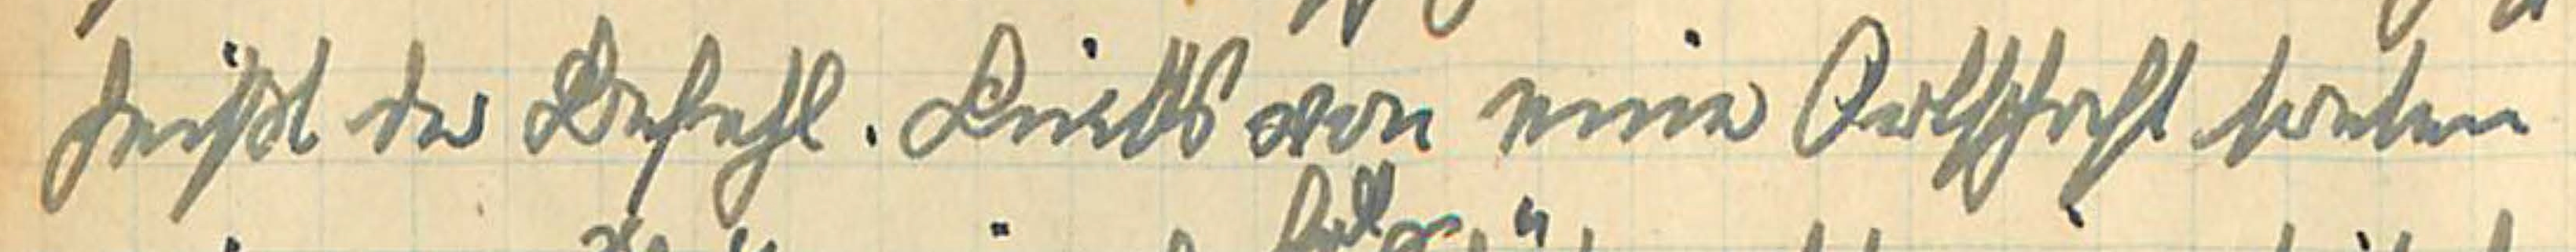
heißt der Befehl. Links von einer Ortschaft treten
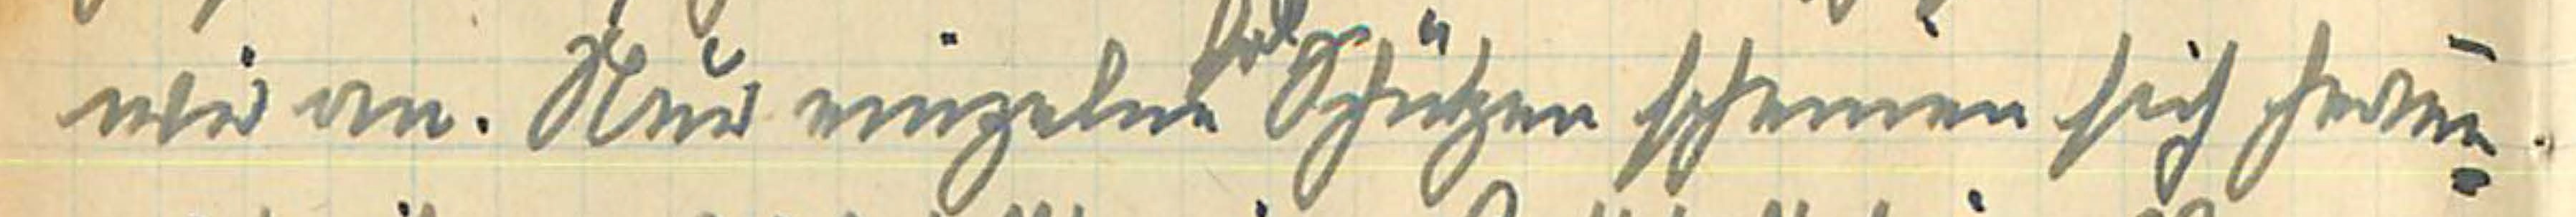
wir an. Nur einzelne Pak Schützen scheinen sich herum-
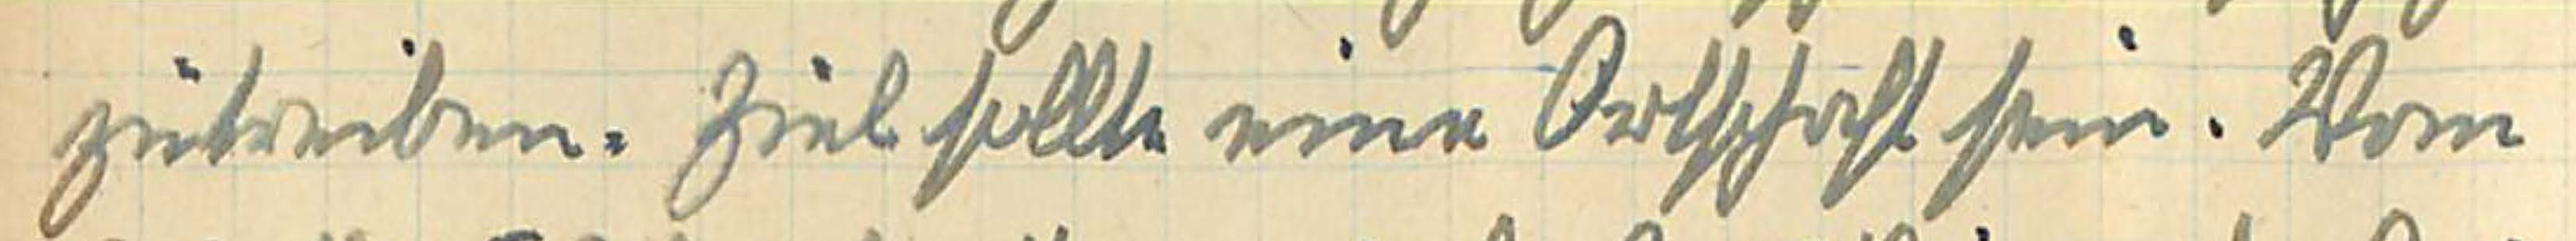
zutreiben. Ziel sollte eine Ortschaft sein. Vom
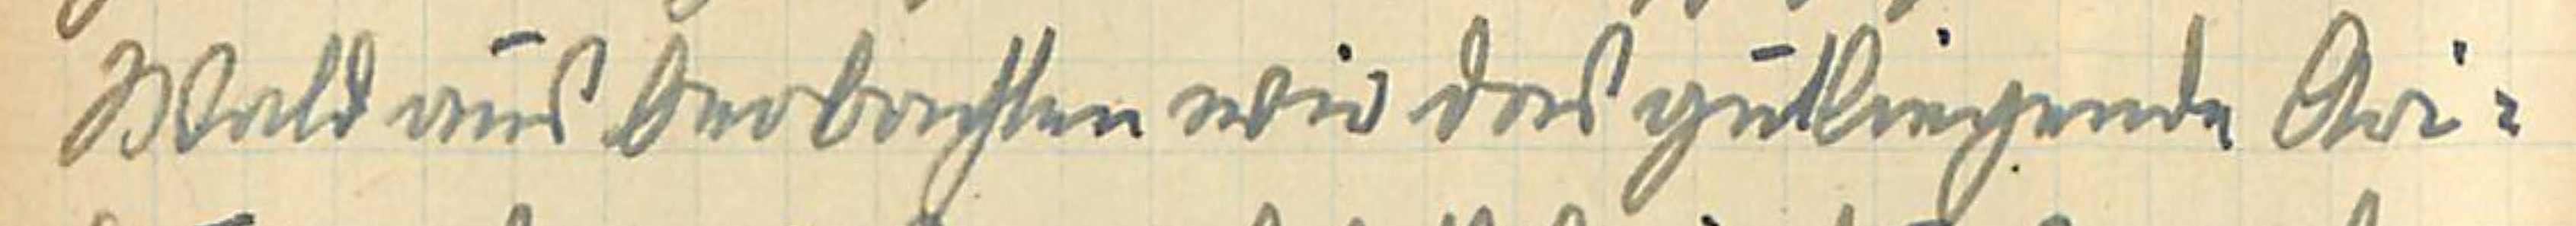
Wald aus beobachten wir das gutliegende Ari-
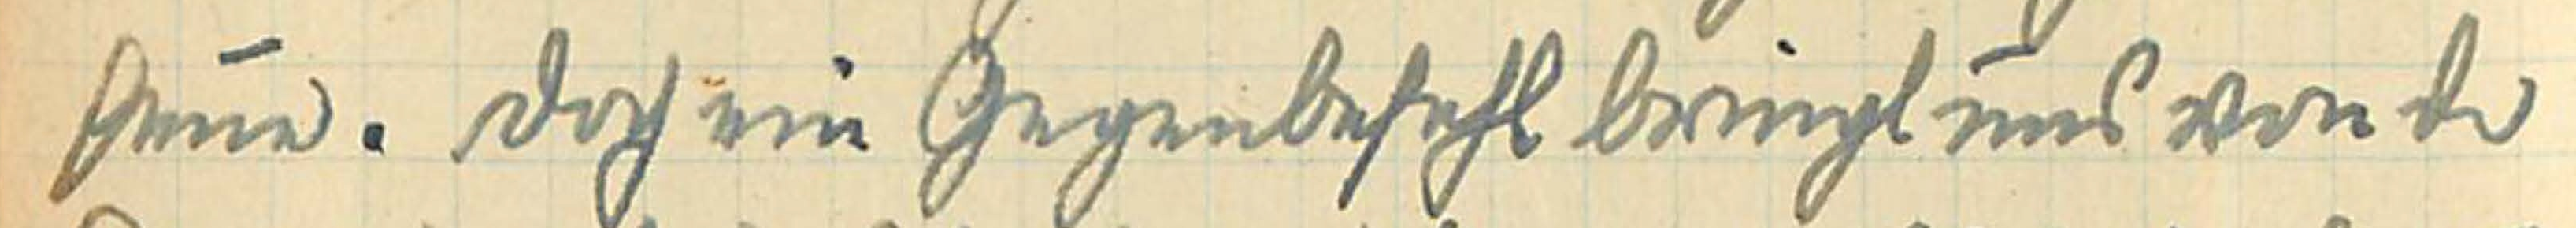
feuer. Doch ein Gegenbefehl bringt uns von der
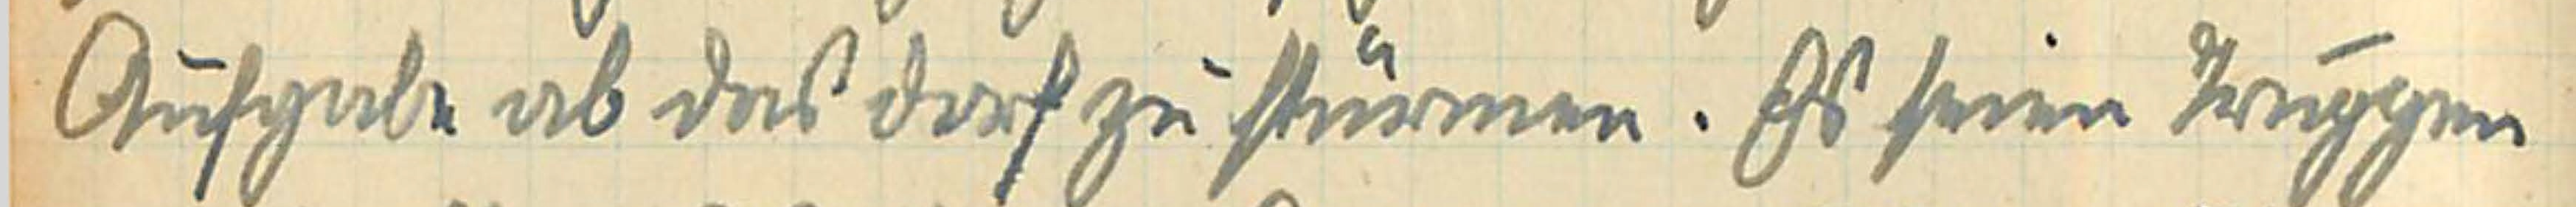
Aufgabe ab das Dorf zu stürmen. Es seien Truppen
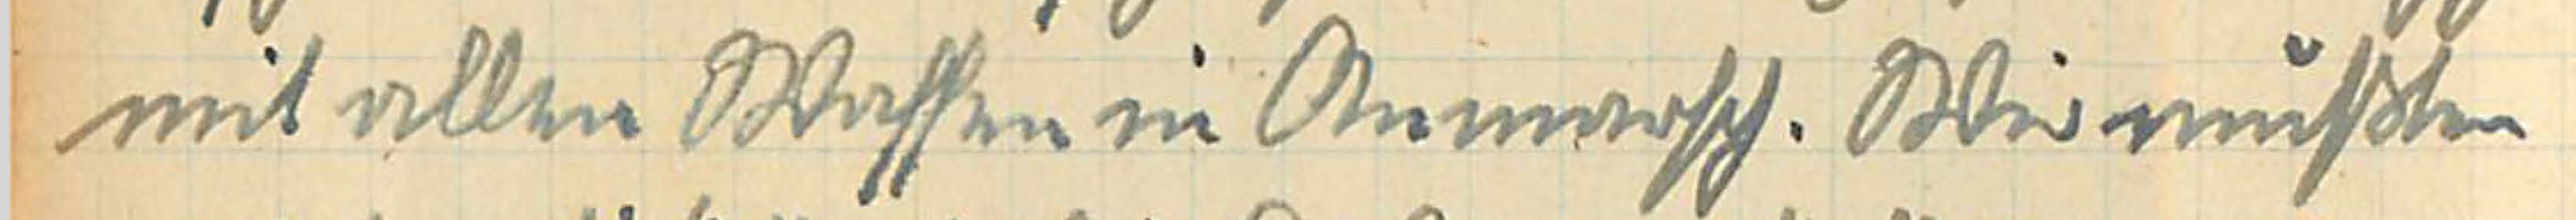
mit allen Waffen in Anmarsch. Wir mußten
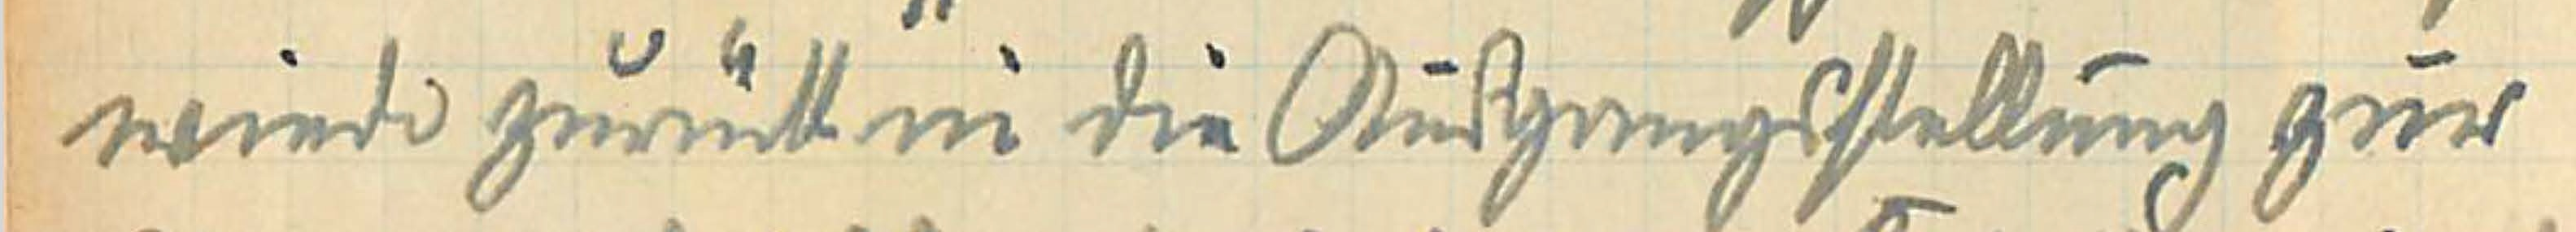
wieder zurück in die Ausgangsstellung zur
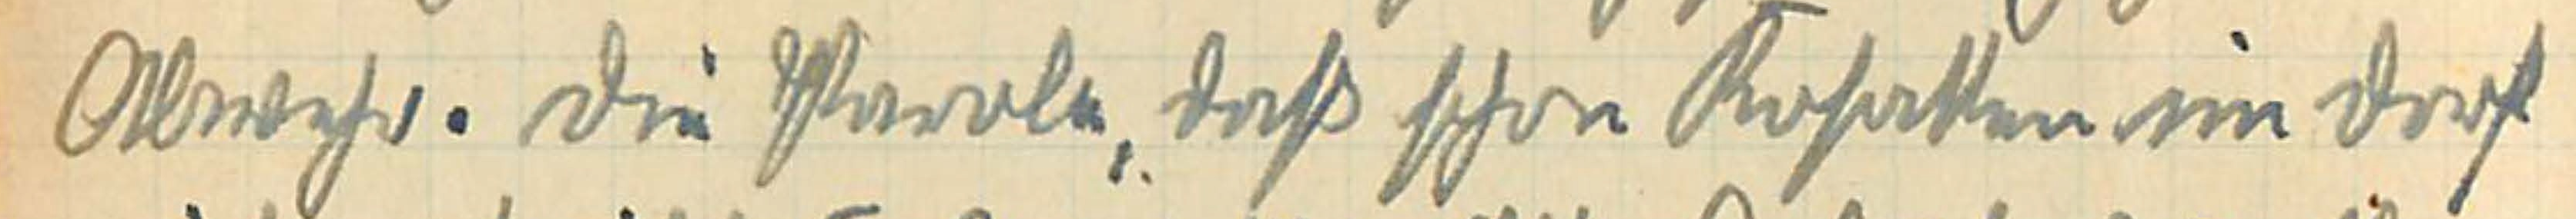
Abwehr. Die Parole, daß schon Kosaken im Dorf
